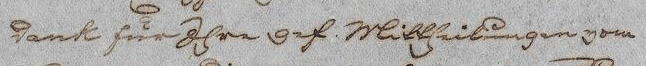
Dank für Ihre gef. Mittheilungen vom
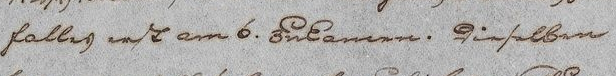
falles erst am 6. zukamen. Dieselben
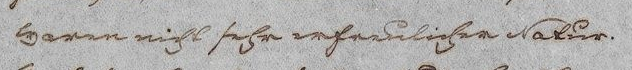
waren nicht sehr erfreulicher Natur.
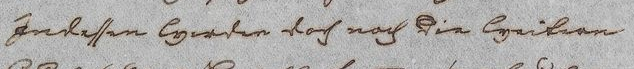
Indessen werden doch noch die weitern
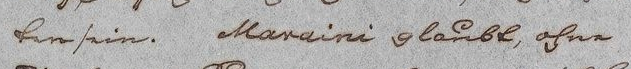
ten sein. Maraini glaubt, ohne
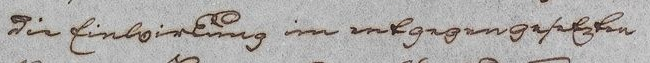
die Einwirkung im entgegengesetzten
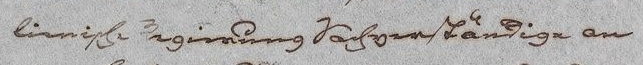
lienische Regierung Sachverständige an
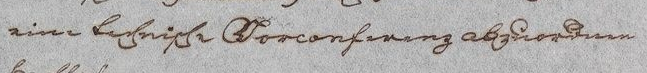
eine technische Vorconferenz abzuordnen
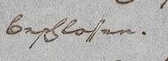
beschlossen.
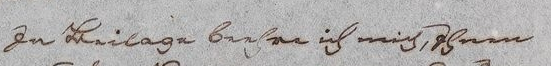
In Beilage beehre ich mich, Ihnen
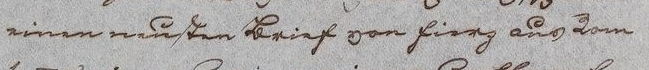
einen neusten Brief von Fierz aus Rom
